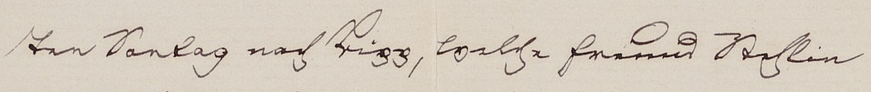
sten Sontag nach Bipp, welche Freund Stehlin
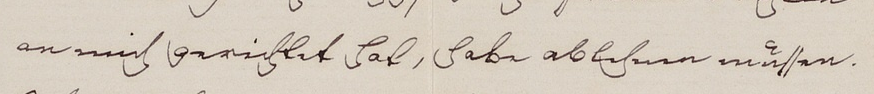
an mich gerichtet hat, habe ablehnen müssen.
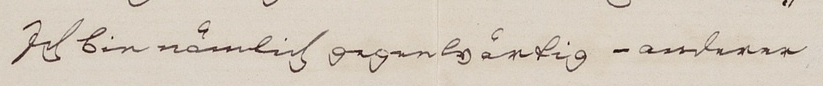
Ich bin nämlich gegenwärtig – anderer
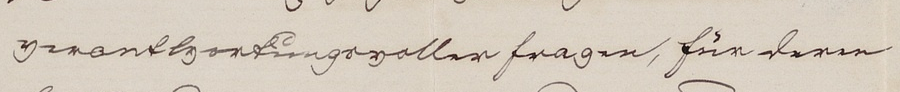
verantwortungsvoller Fragen, für deren
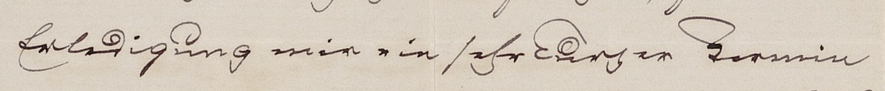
Erledigung mir ein sehr kurzer Termin
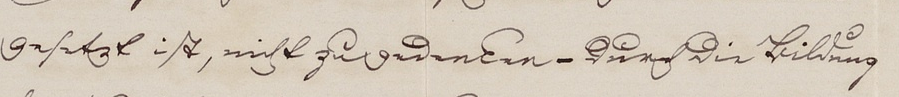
gesetzt ist, nicht zu gedenken – durch die Bildung
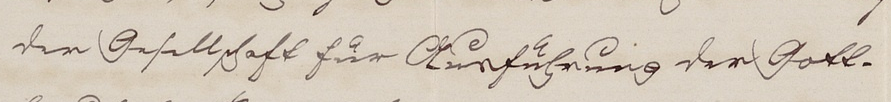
der Gesellschaft für Ausführung der Gott-
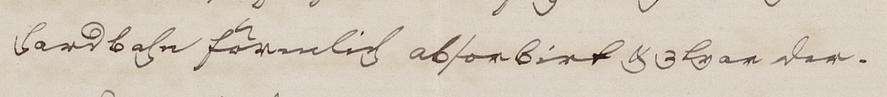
hardbahn förmlich absorbirt & zwar der-
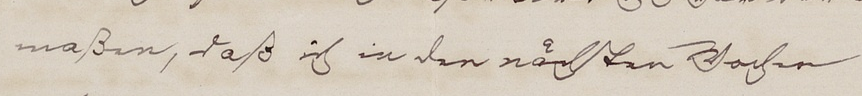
maßen, daß ich in den nächsten Wochen
